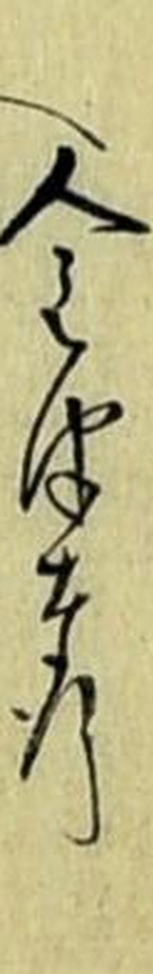金津奉行
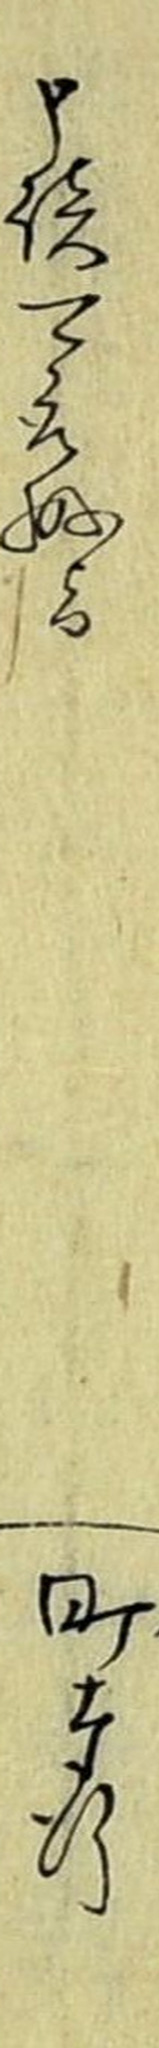申談可取扱旨町奉行
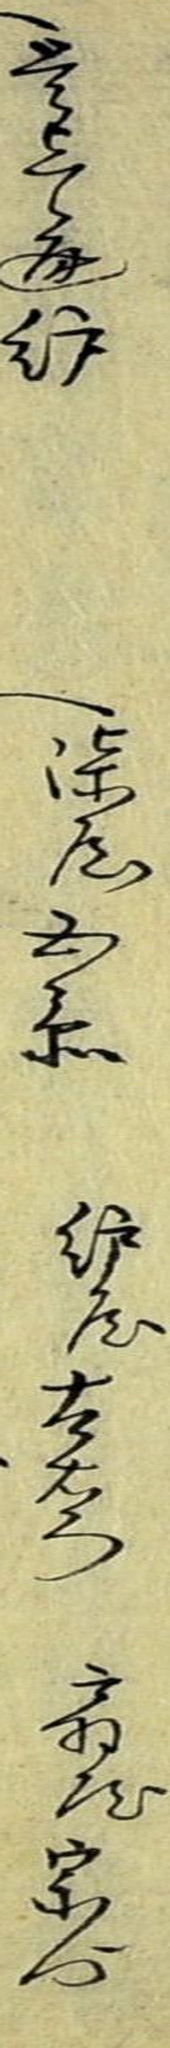○是迄之通䋆漆屋五兵衛䋆屋太右衛門扇屋宗右衛門
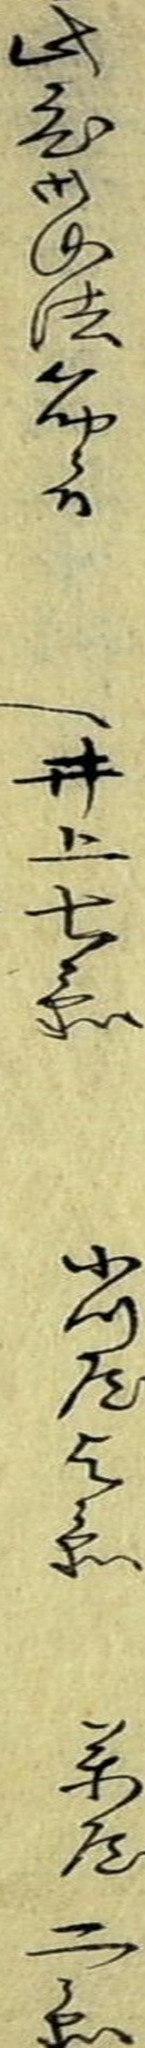此度御趣法筋に付井上七兵衛小川屋与兵衛茶屋二兵衛
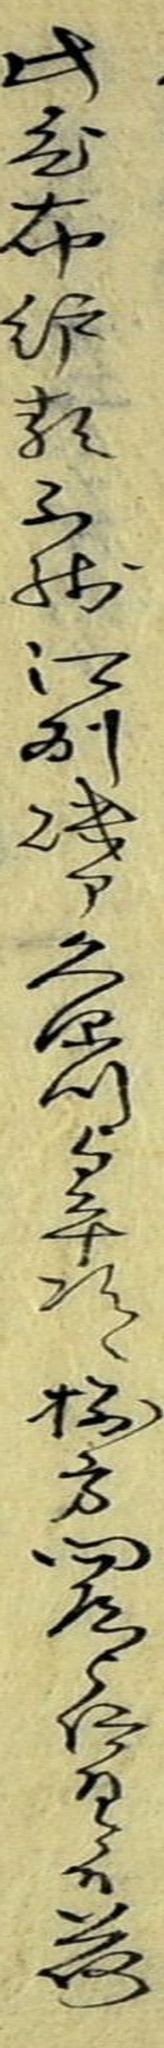此度布䋆類不残江州磯部久保川与平次へ捌方問屋被仰付候に付荷
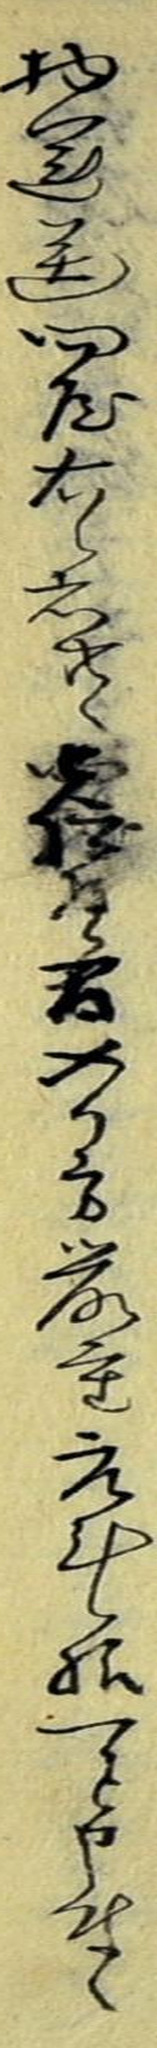物運送問屋左之者共へ被仰付候間〆り方厳重取斗候様可被申候

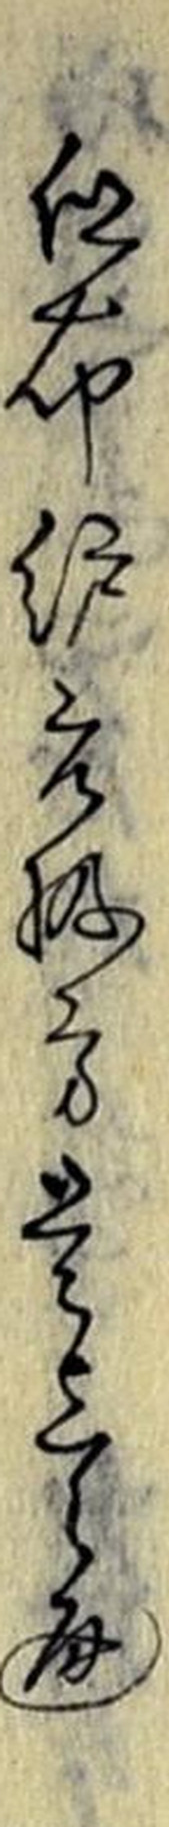但布䋆取扱方是迄之通
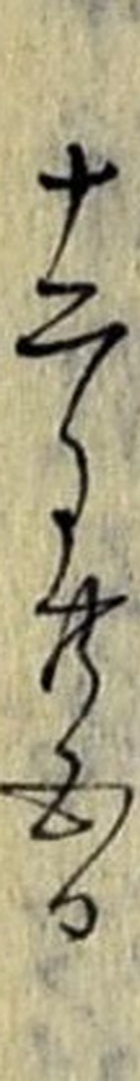十二月廿五日
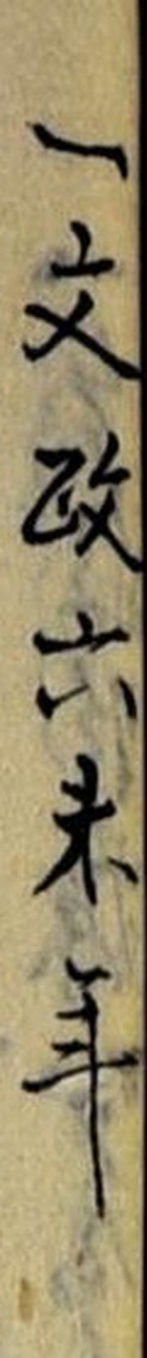一文政六未年
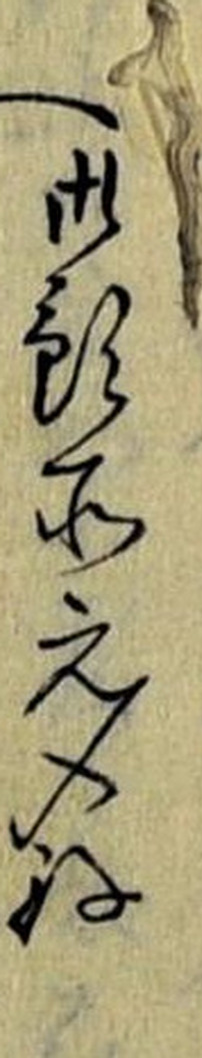御預所元〆役
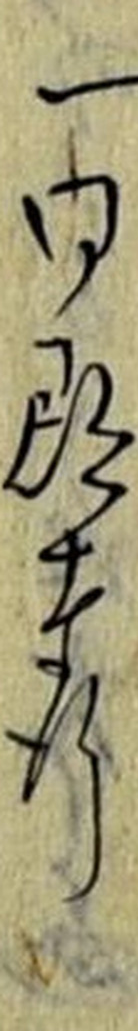同郡奉行
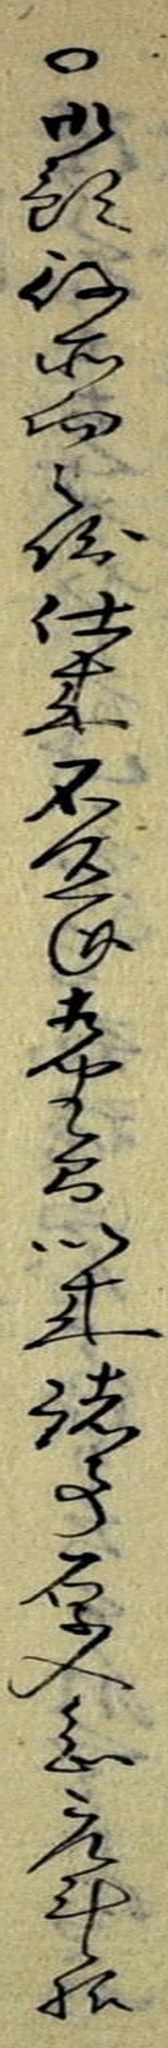○御預役所向之儀仕来不宜趣相聞候間以来諸事厚入念取斗候様
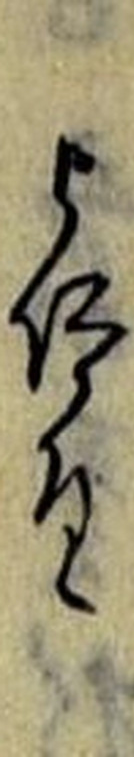被仰付候
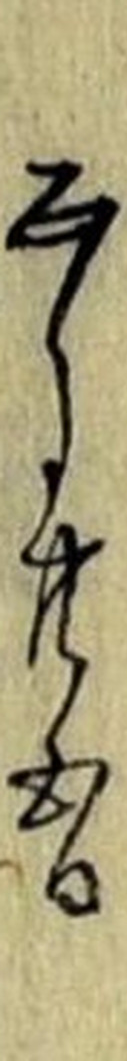正月廿五日
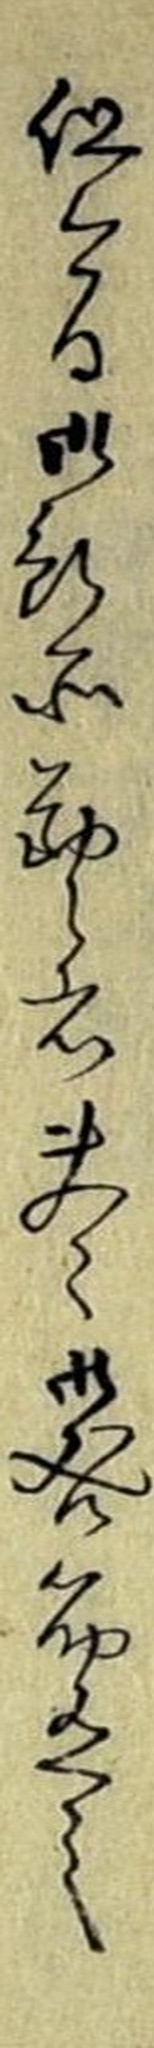但今日御預所勤之者夫々御咎筋有之
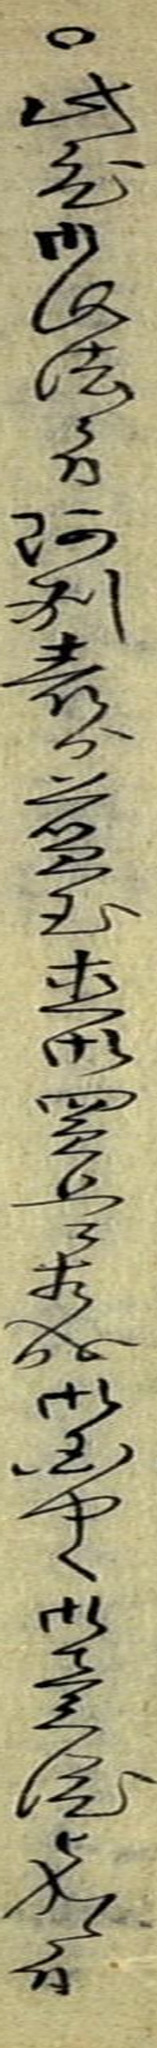○此度御趣法に付阿州表ゟ藍玉直御買上に相成御国中へ御売渡被成候に付
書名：命令之部 四
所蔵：福井県文書館 Fukui Prefectural Archives
